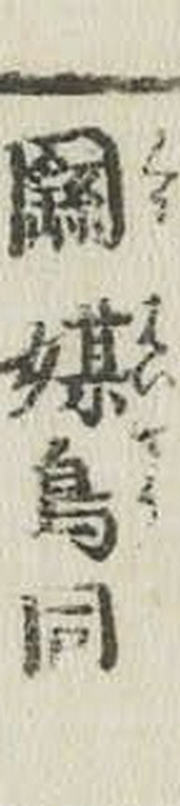㘥媒鳥同
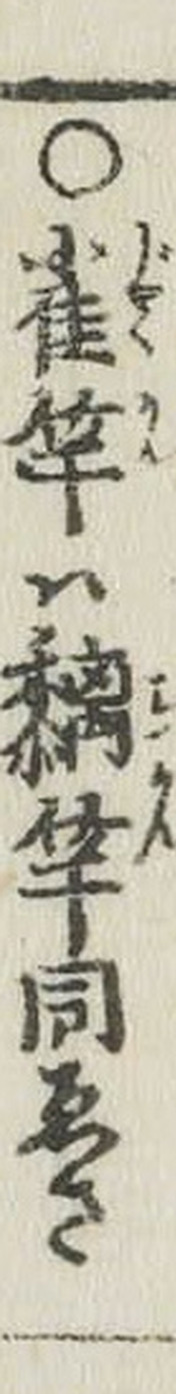○雀竿は黐竿同ゑさ
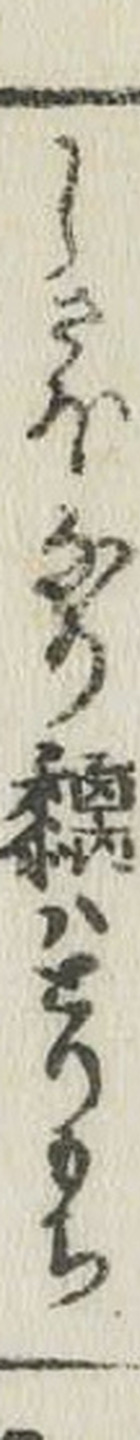しさほなり黐はとりもち
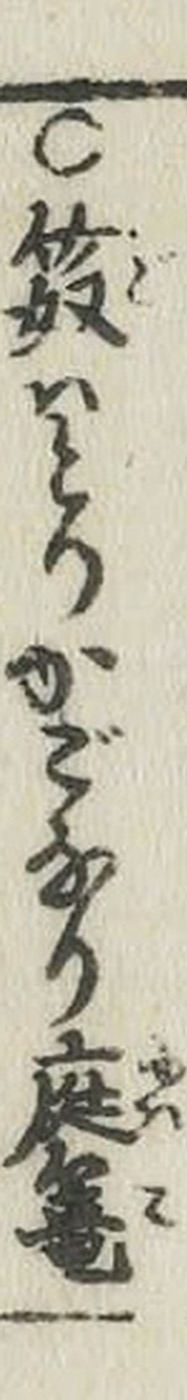○笯はとりかごなり庭篭
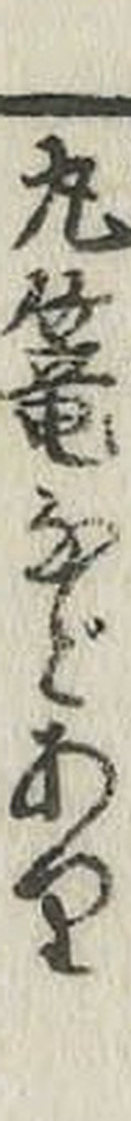丸篭などあり
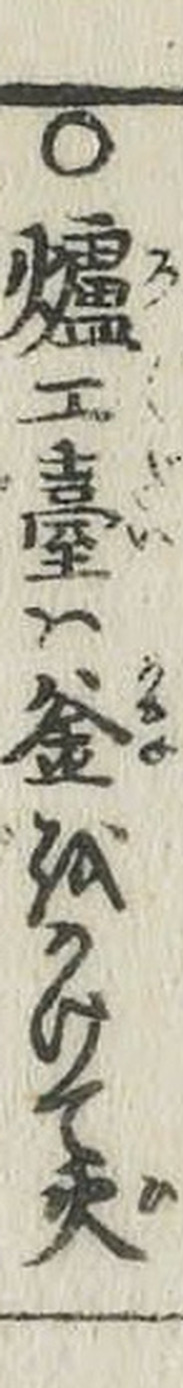○炉工台は釜をかけて火
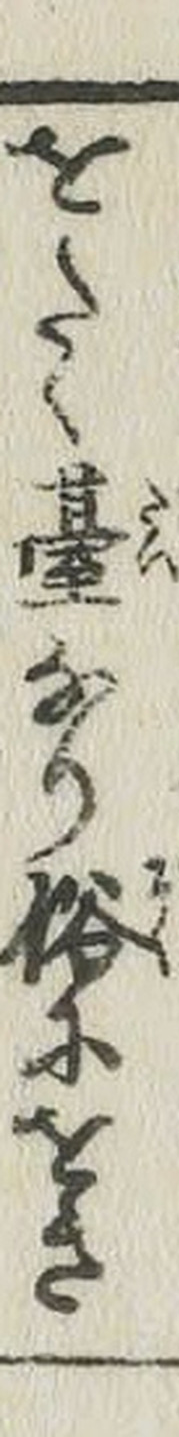をたく台なり俗にをき
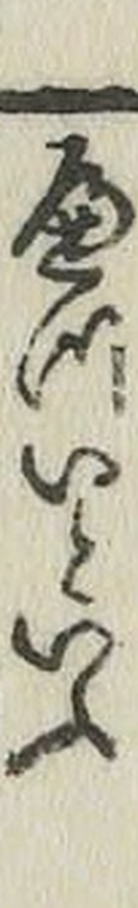へついといふ
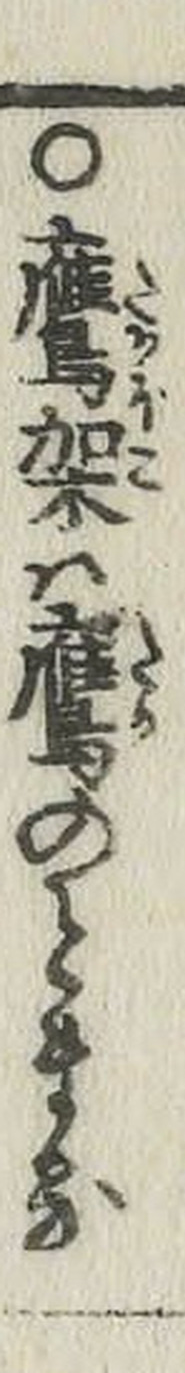○鷹架は鷹のとまる
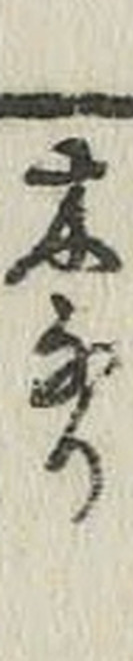木なり
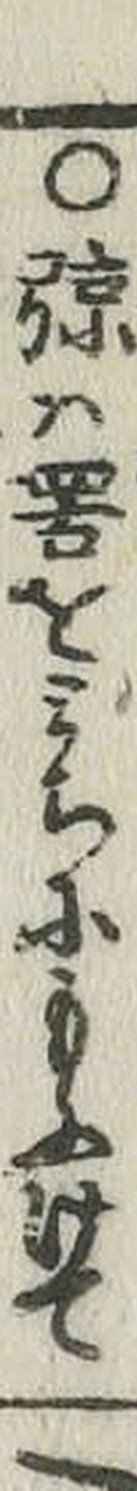○弶は罟をみちにもふけて
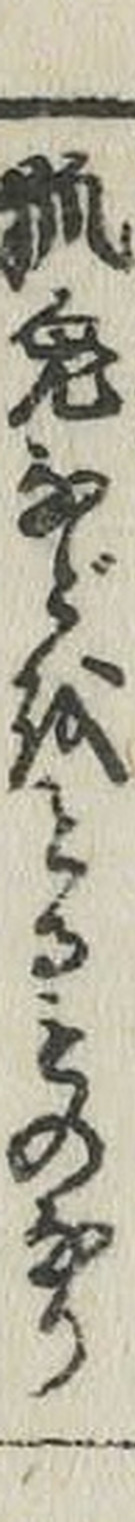狐兎などをとるものなり

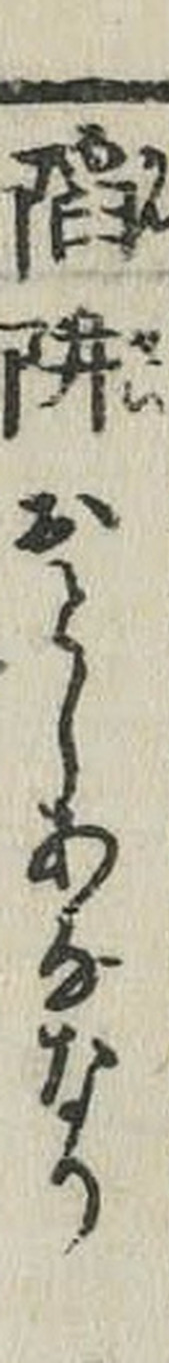陷阱おとしあななり
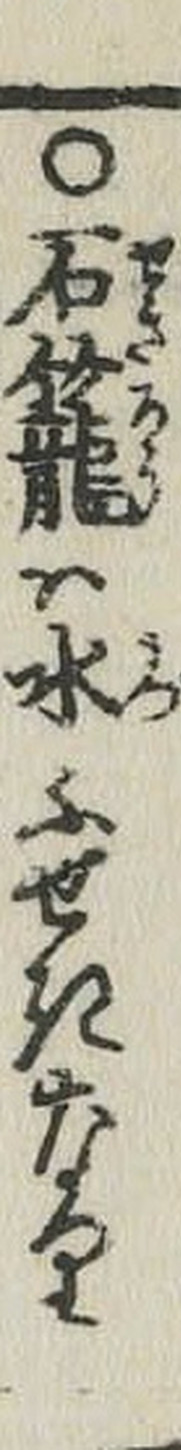○石籠は水ふせきなり
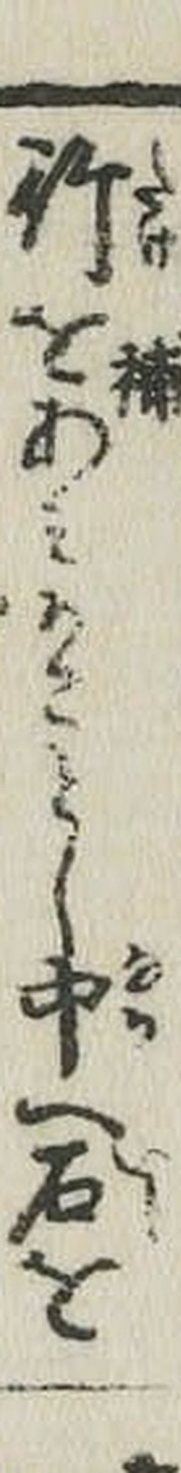竹をあみかことし中へ石を
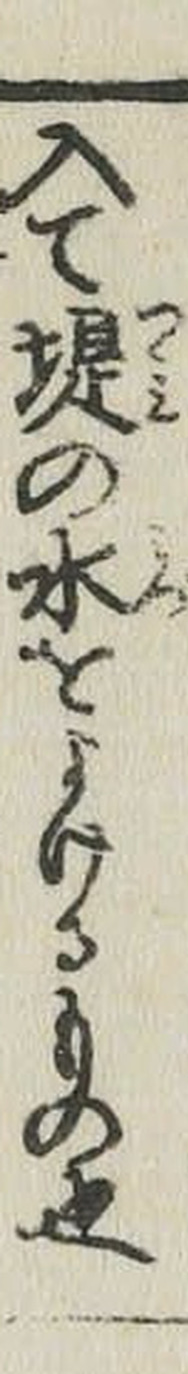入て堤の水をよけるもの也
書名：増補頭書訓蒙図彙大成 10巻 5:巻之9-11
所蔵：東京学芸大学教育コンテンツアーカイブ
